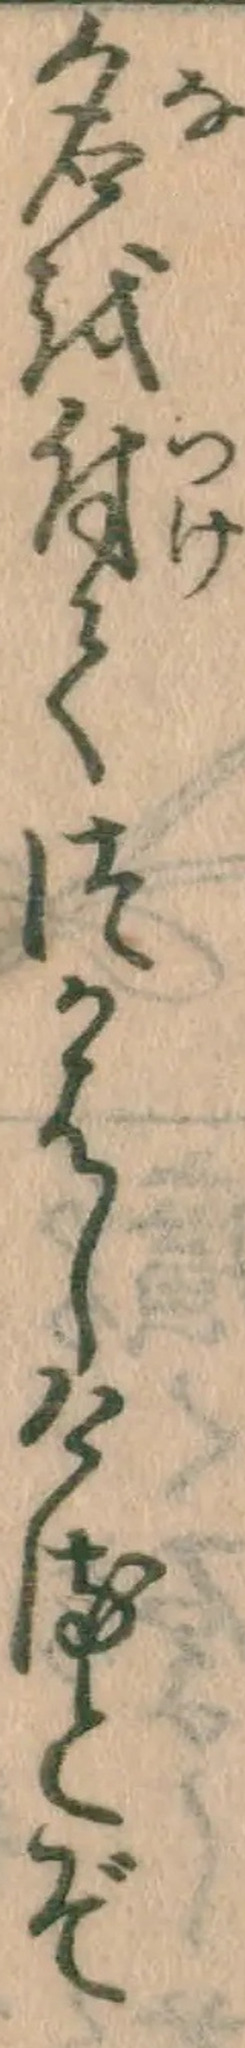名を付てつかはしけるとぞ
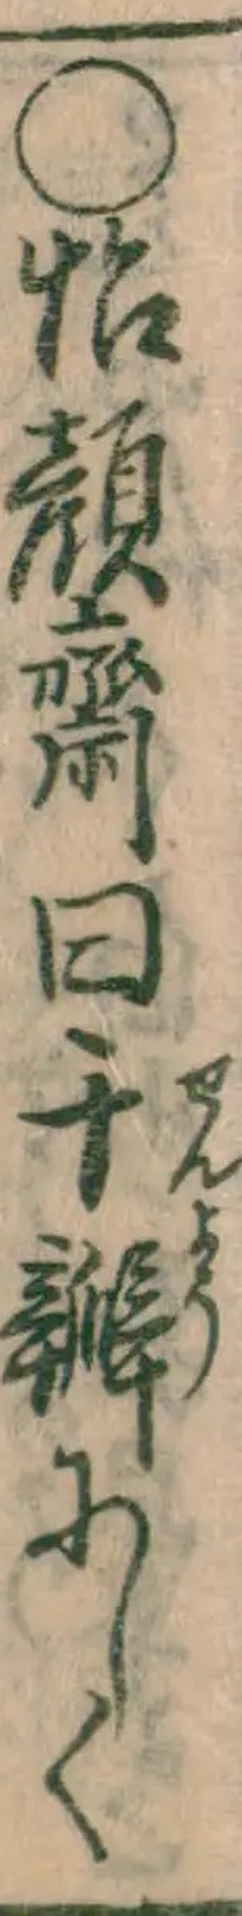○怡顔斎曰千弁にして
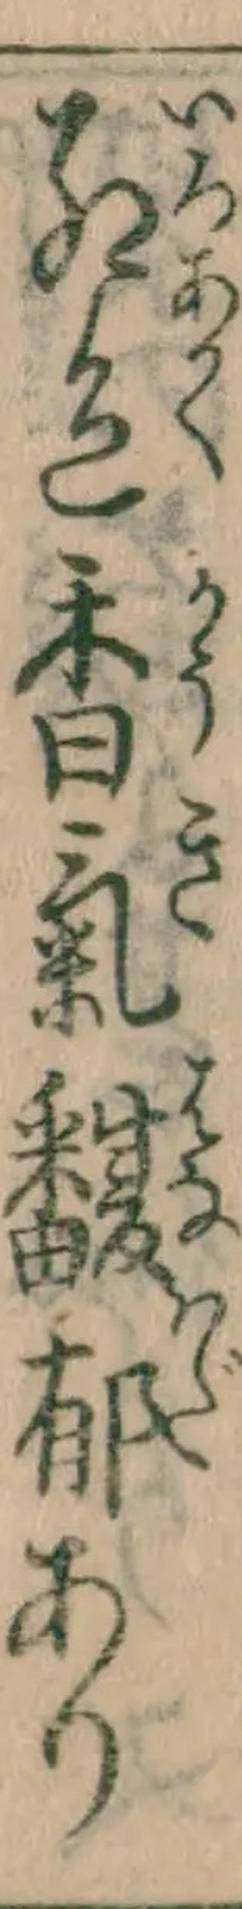紅色香気馥郁あり
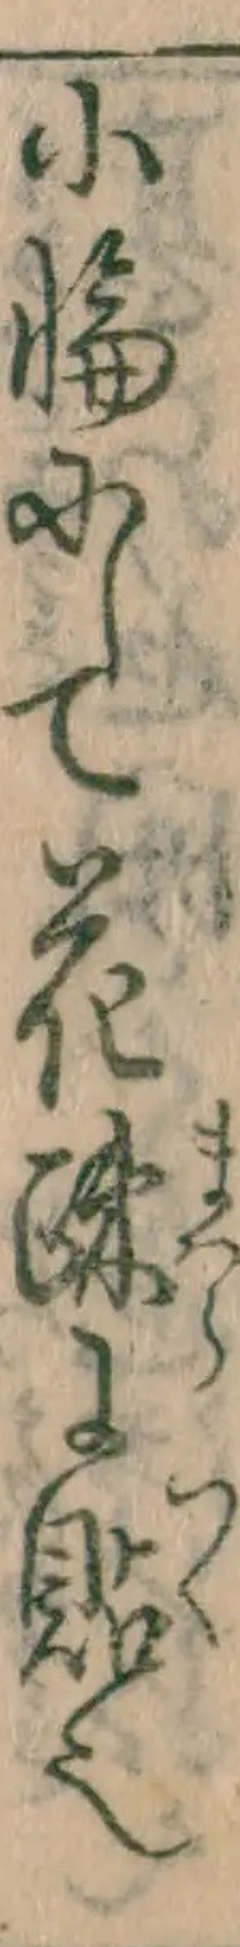小輪にして花疎に貼也
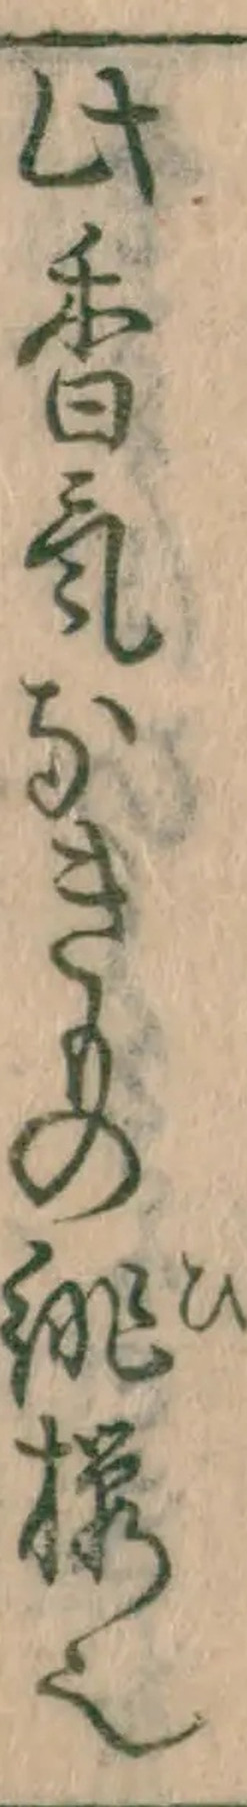此香気なきもの緋桜也
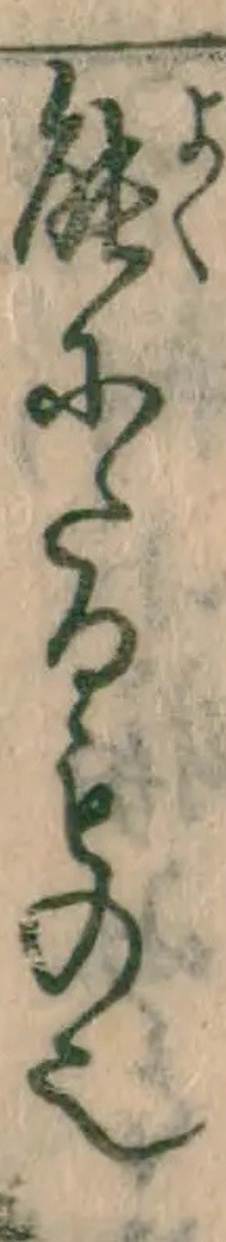能にたるもの也

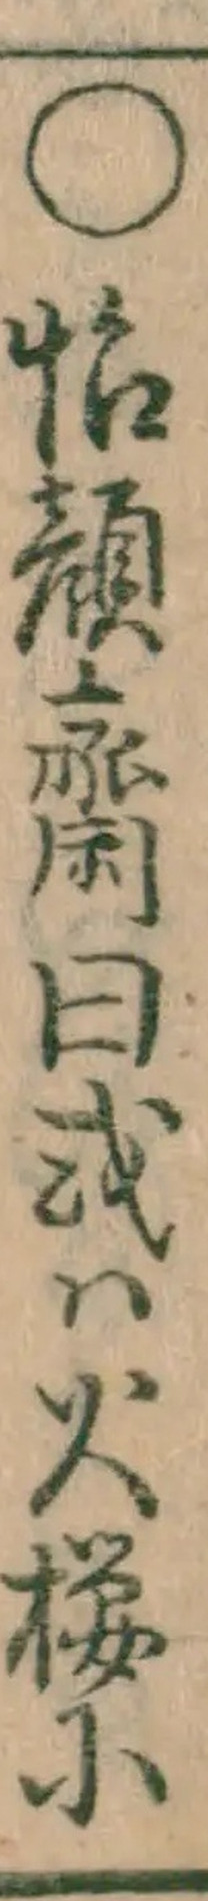○怡顔斎曰或は火桜に
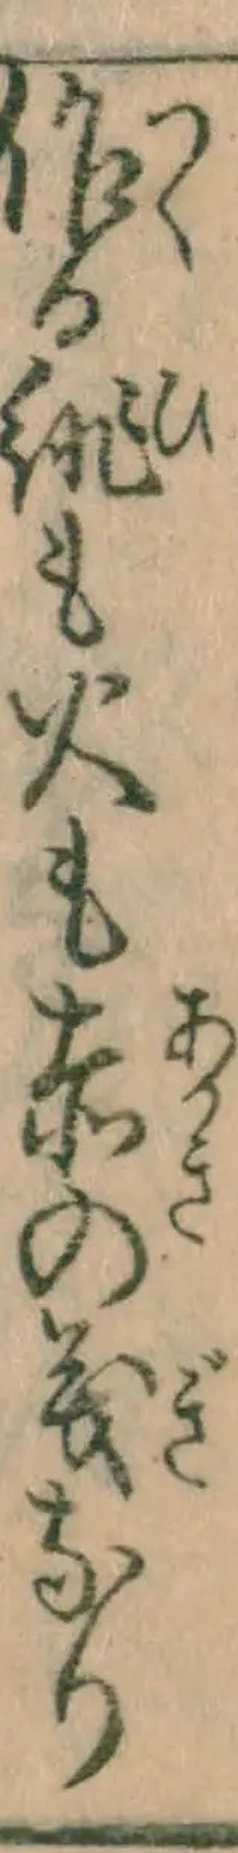作る緋も火も赤の義なり
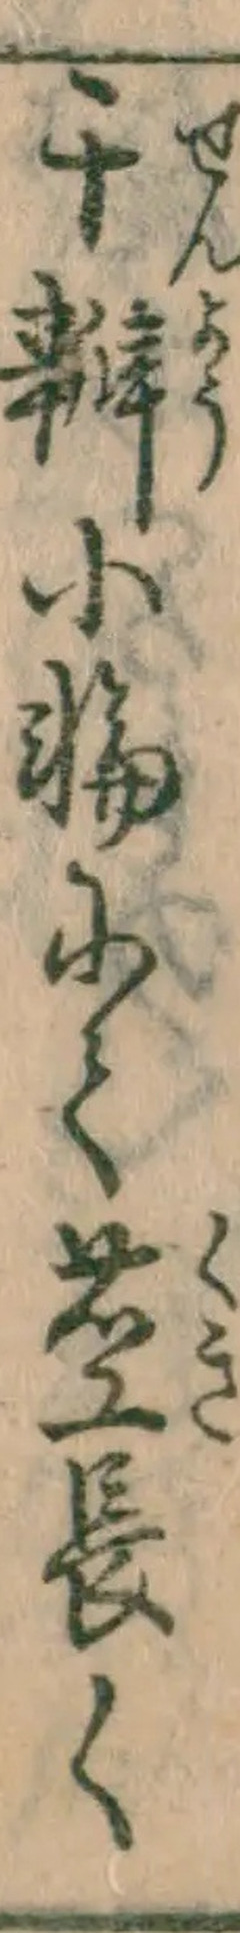千弁小輪にて茎長く
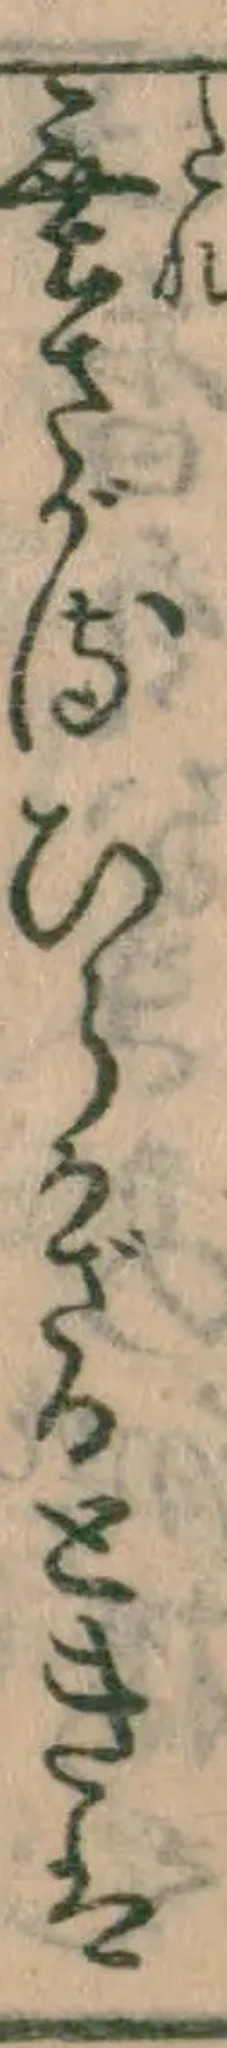垂さがるひらかざるときは
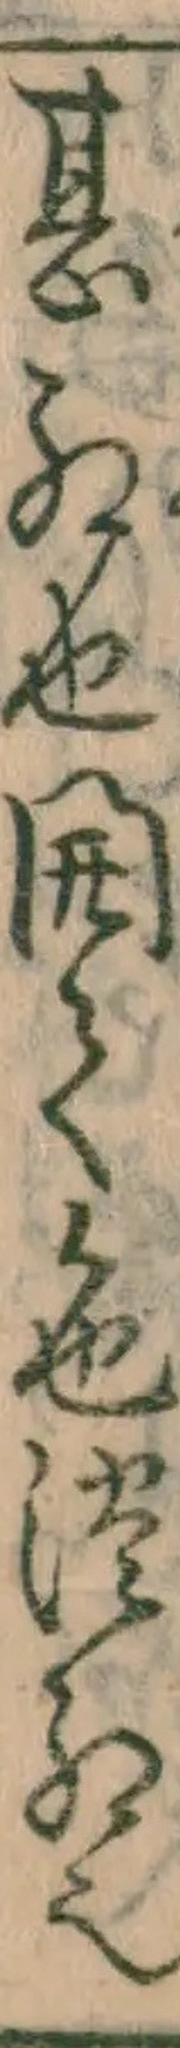甚紅也開て色淡紅也
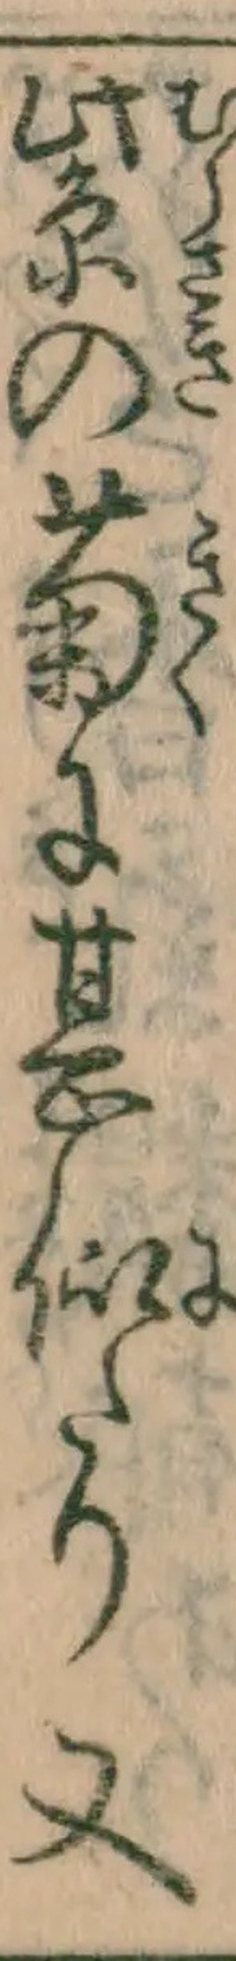紫の菊に甚似たり又
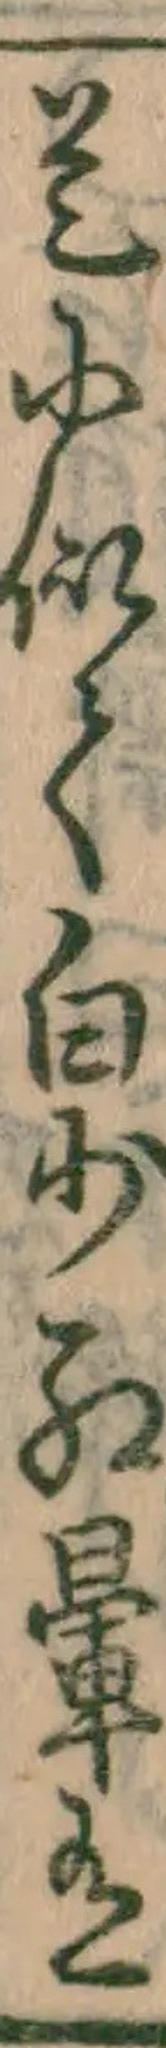是に似て白少紅暈有
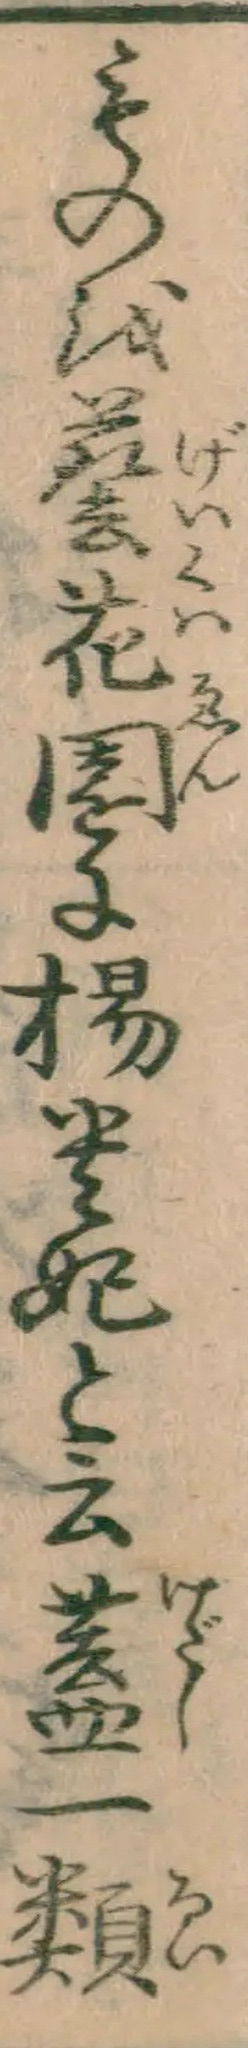ものを芸花園に楊貴妃と云蓋一類
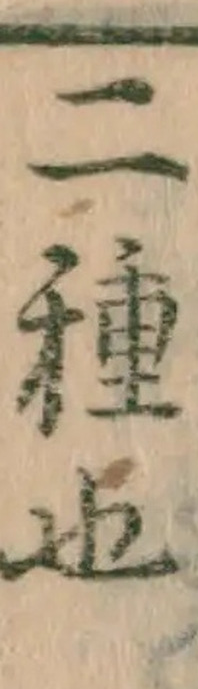二種也
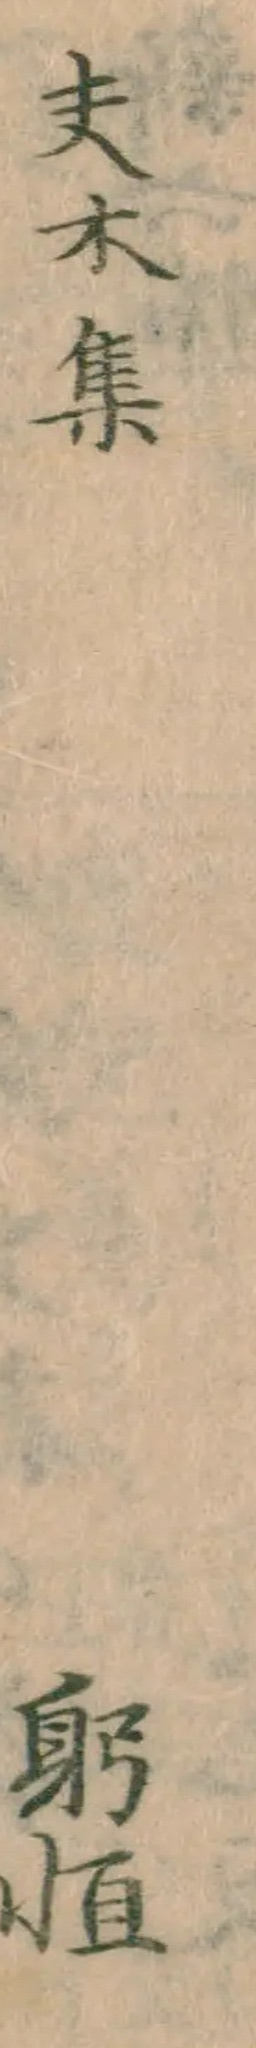夫木集躬恒
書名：怡顔齋櫻品
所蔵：国立国会図書館 National Diet Library, JAPAN
